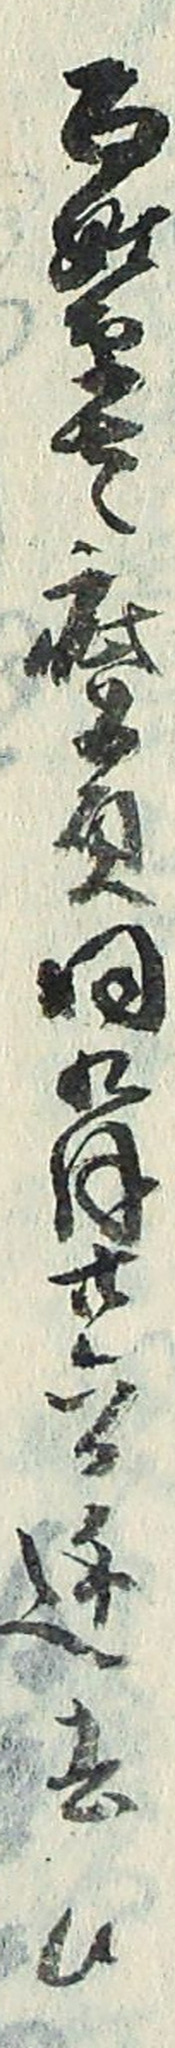百姓平七へ疵為負同九月廿六日逃去候
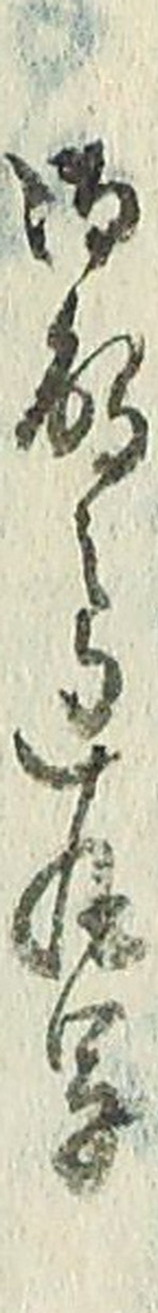御触之通丸写
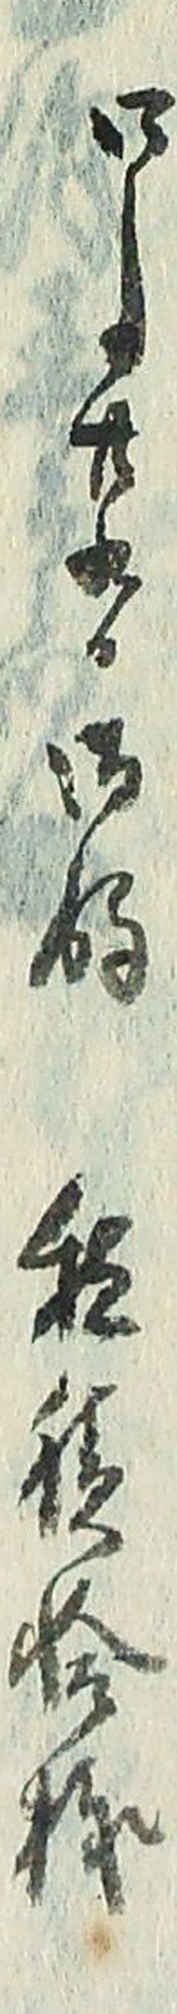四月廿九日御触穂積恰様
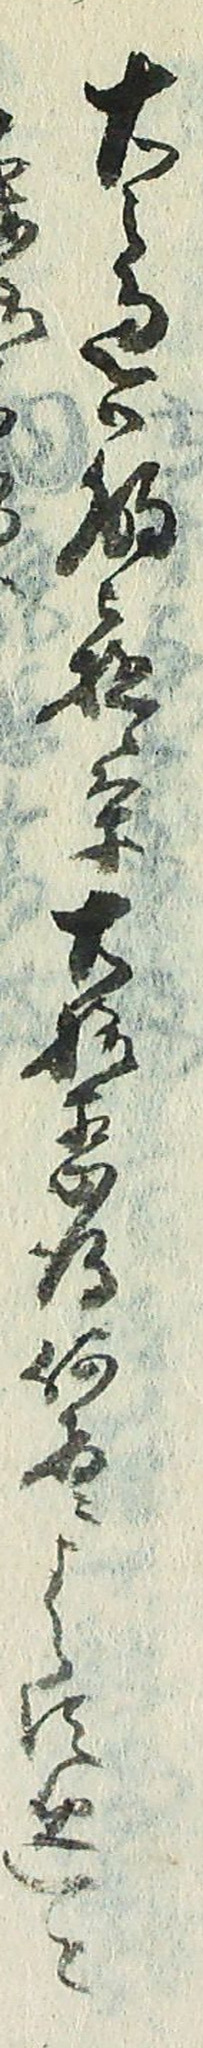右之通御触被遊候条右様相心得何者によらす逸々
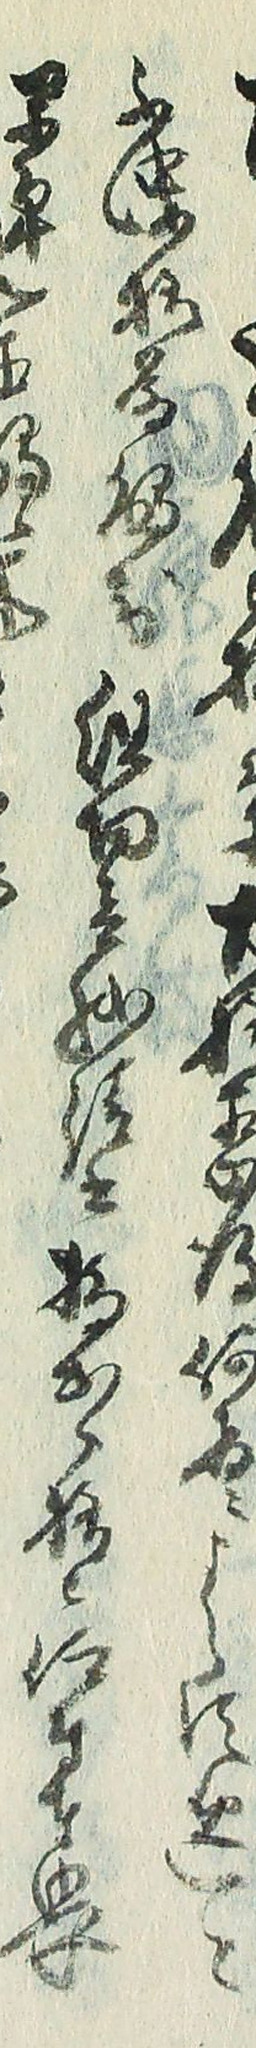不洩様為触知組切壱紙請書指出候様被仰付奉畏
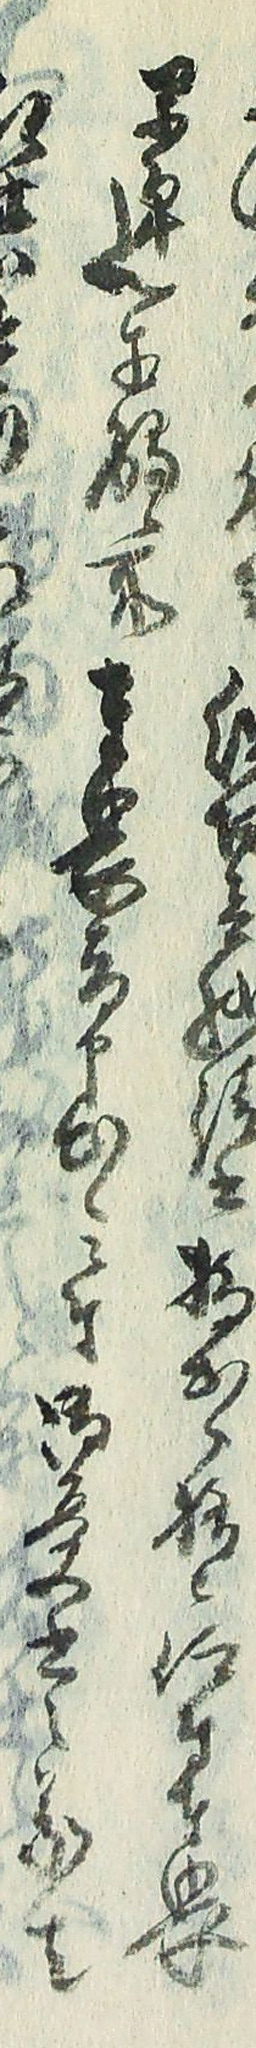早速相触候所奉畏旨申出候に付御受書之義は
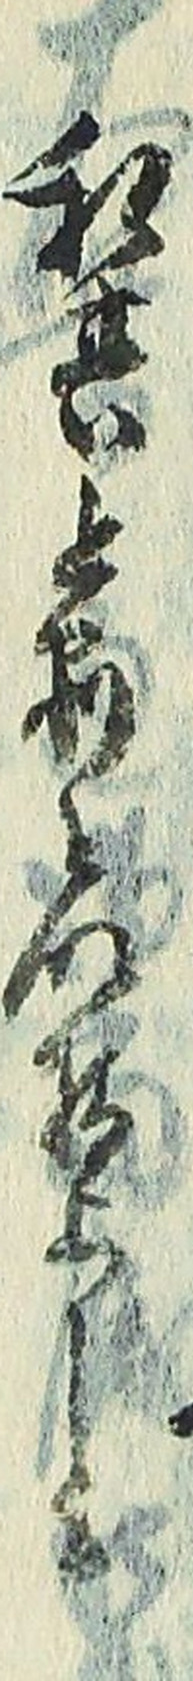私共連判を以指上申候以上
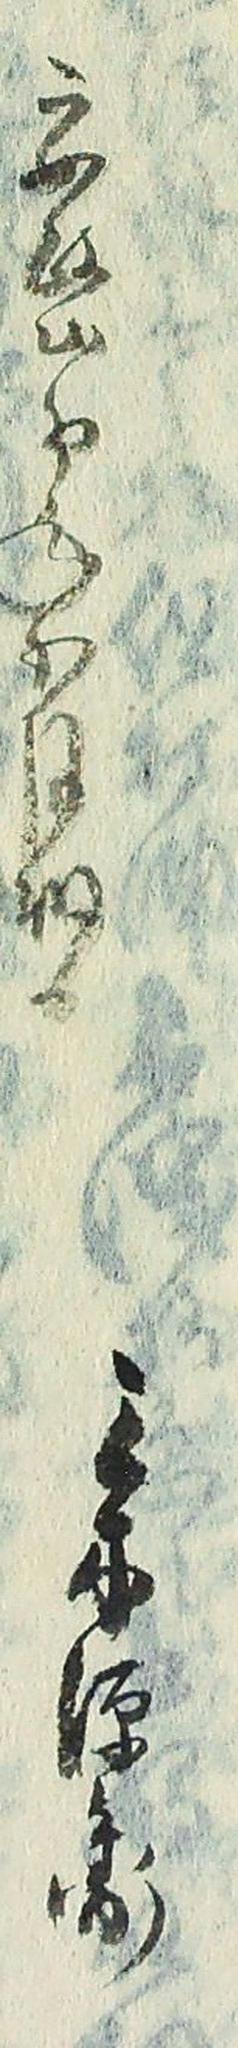安政弐卯年五月朔日井貝八郎次
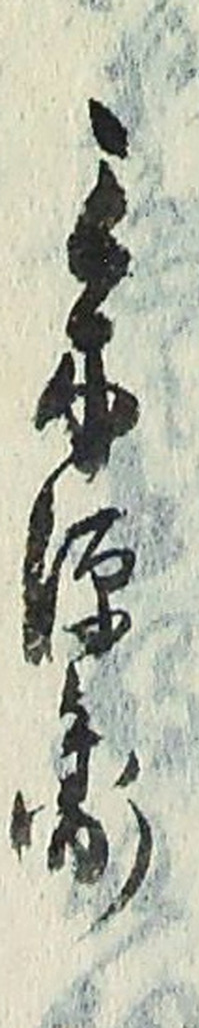三木源兵衛
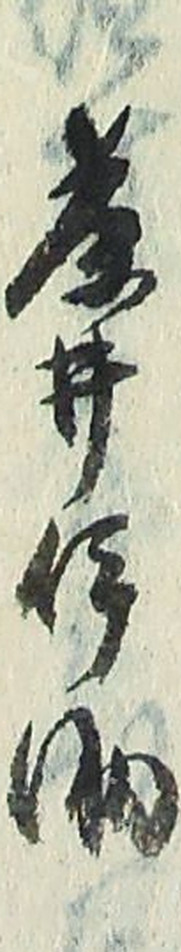藤井伊助
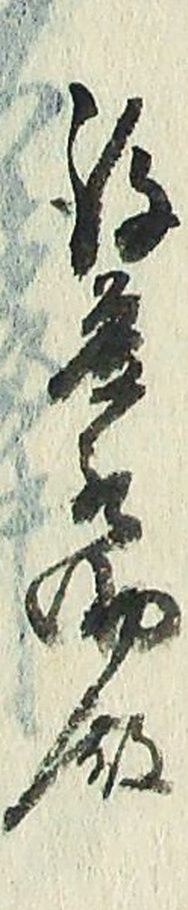後藤庄助殿
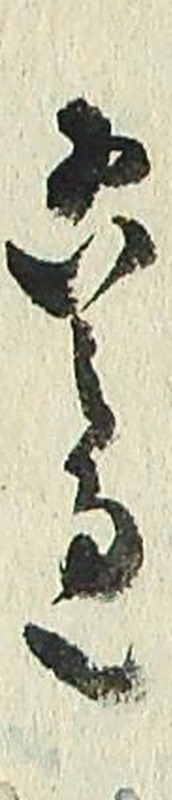右之通
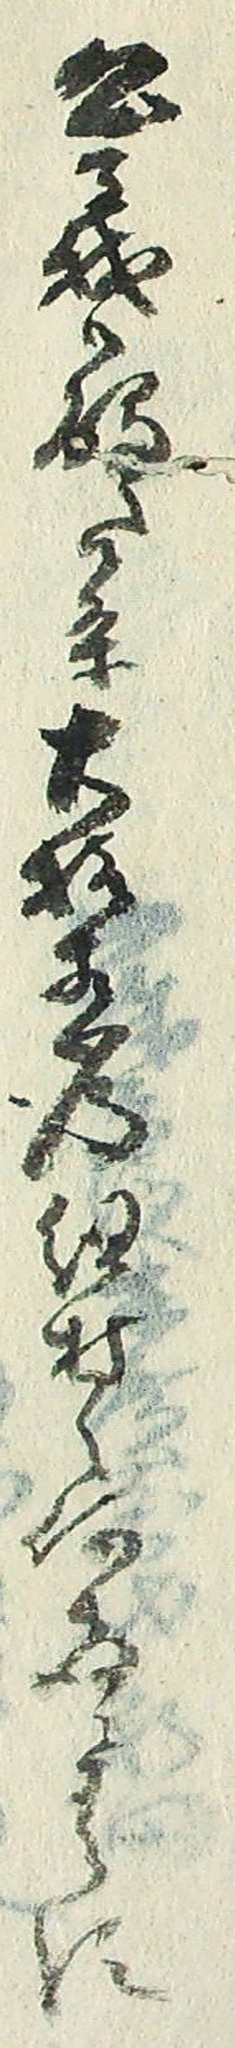公義御触に候条右様相心得組村々何者によらす

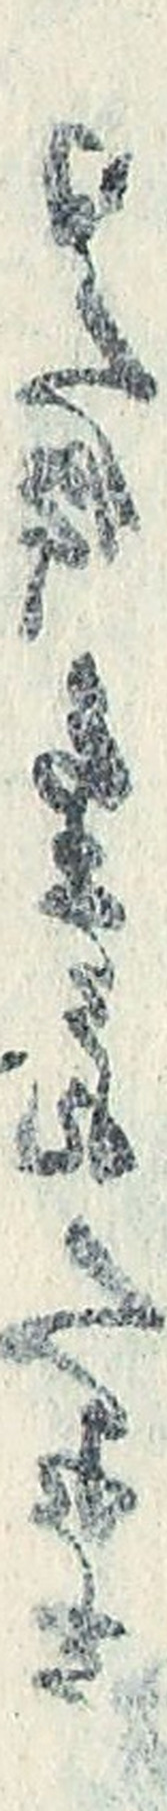五月十四日
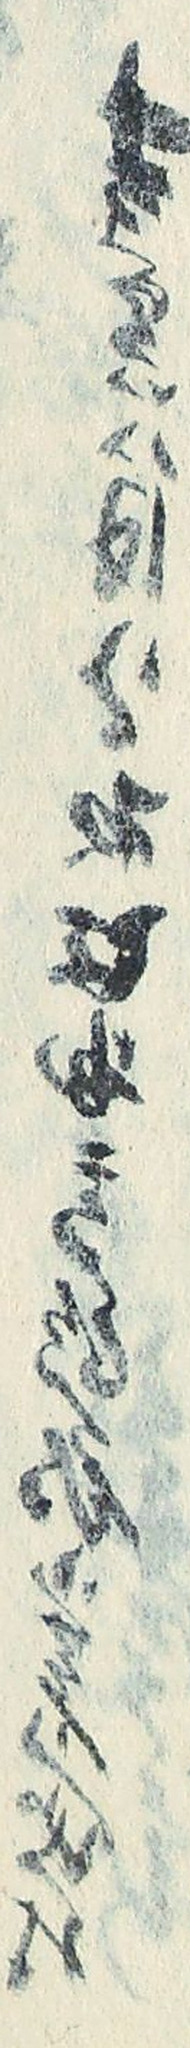五月十四日
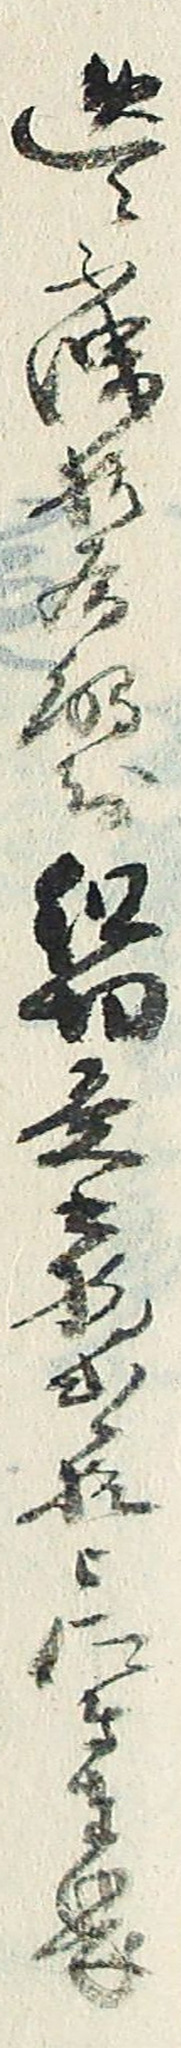逸々不洩様触知組切受書指出候様被仰付奉畏
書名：諸御用御□受書控
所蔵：鳴門教育大学 Naruto University of Education
